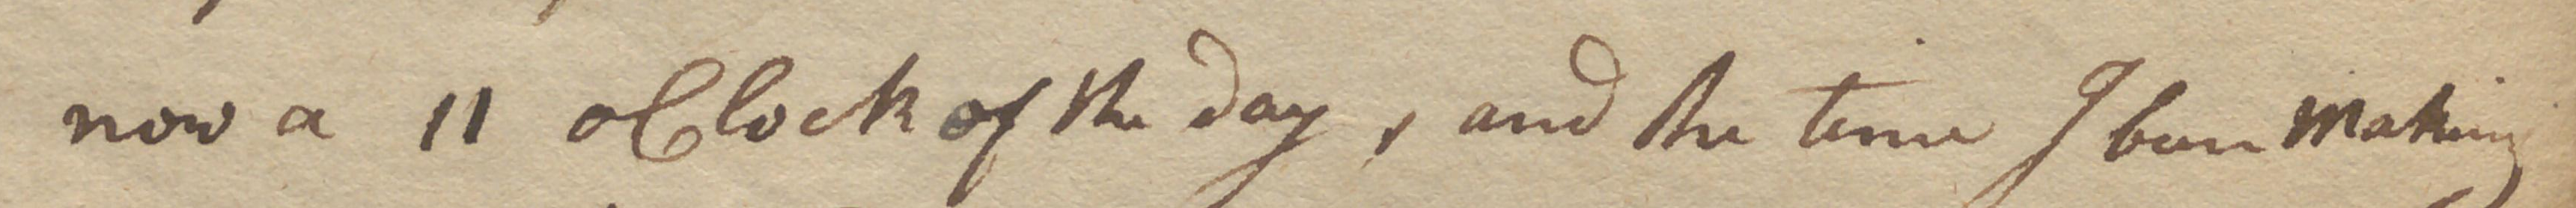now a 11 oClock of the day, and the time I been Making
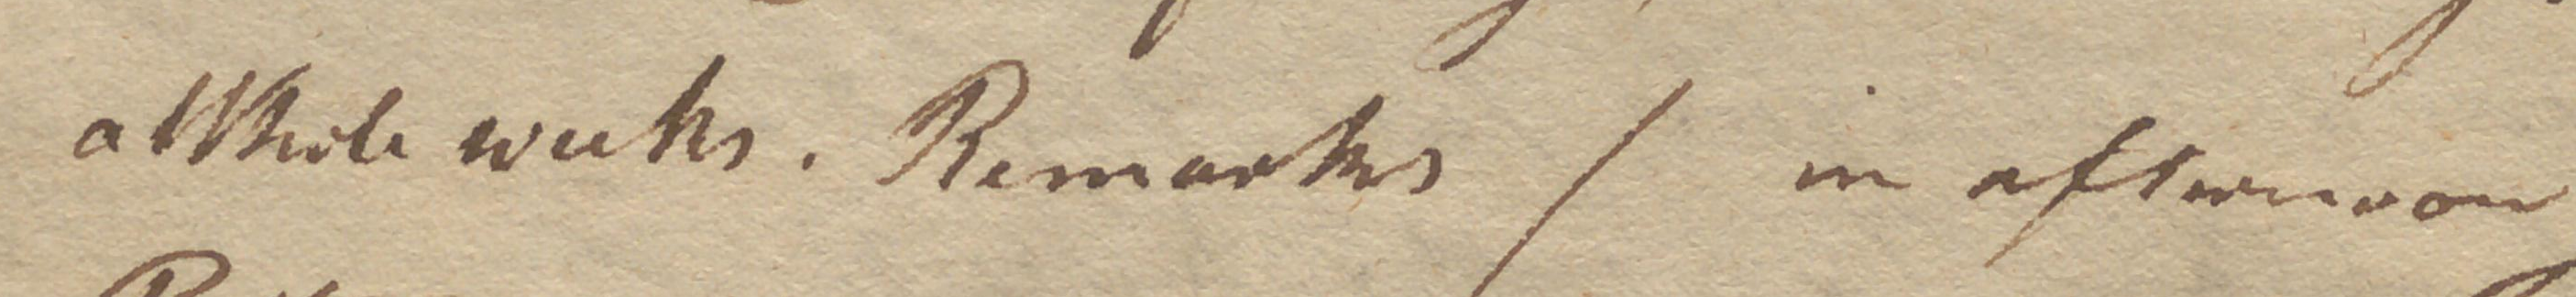a Whole weeks. Remarks / in afternoon
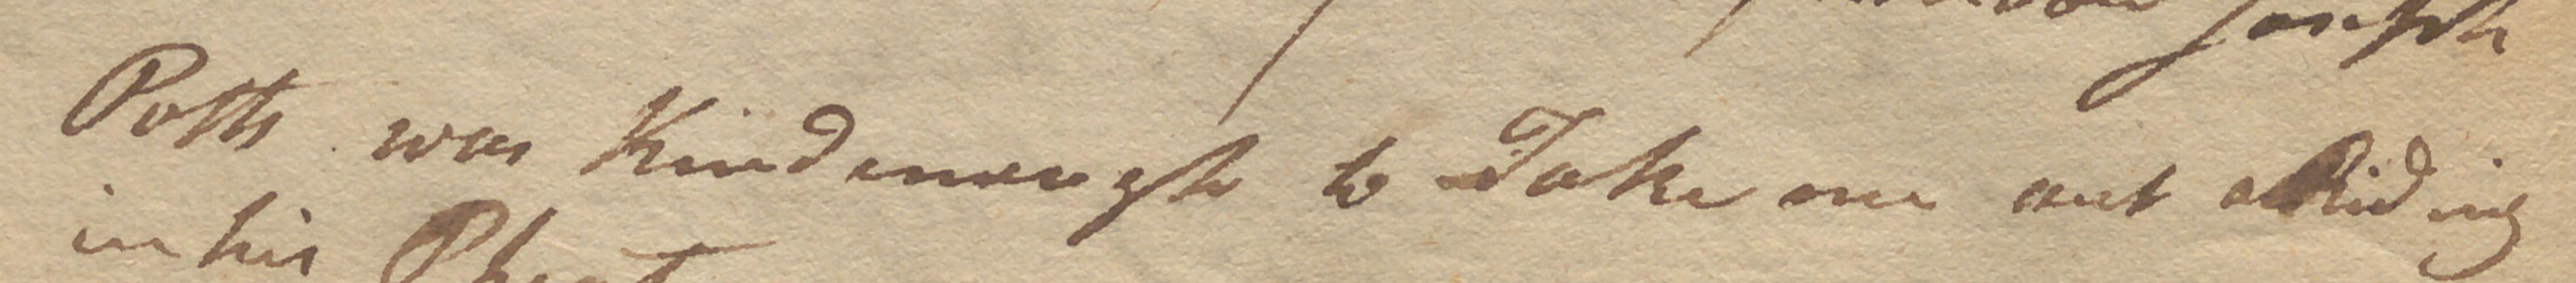Potts was Kind enough to Take me out a Riding
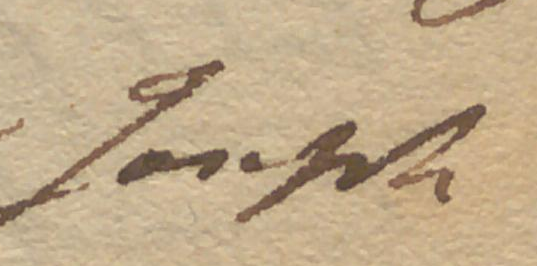Joseph
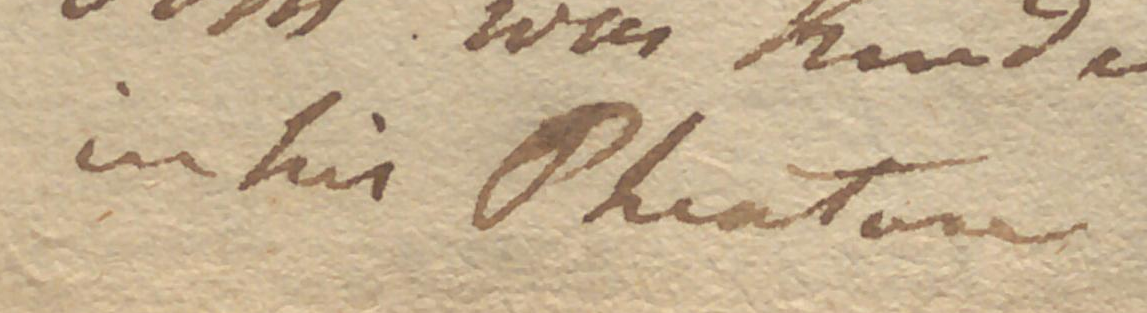in his Pheaton
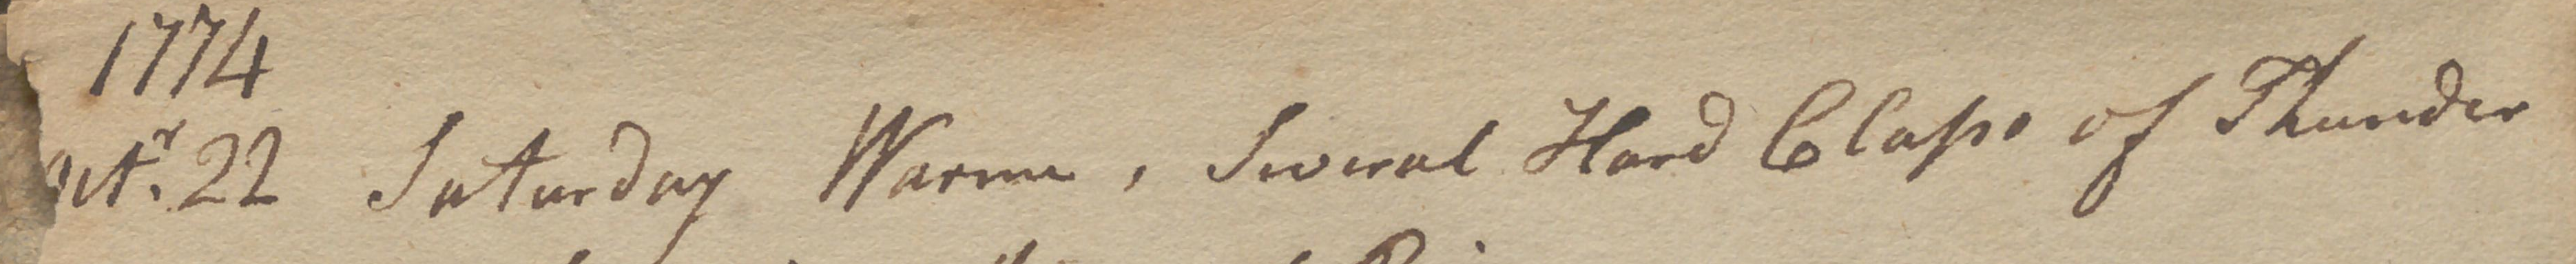Oct^r. 22t Saturday Warme, Several Hard Claps of Thunder
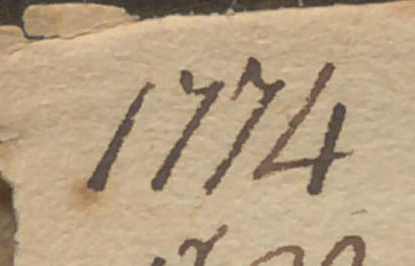1774
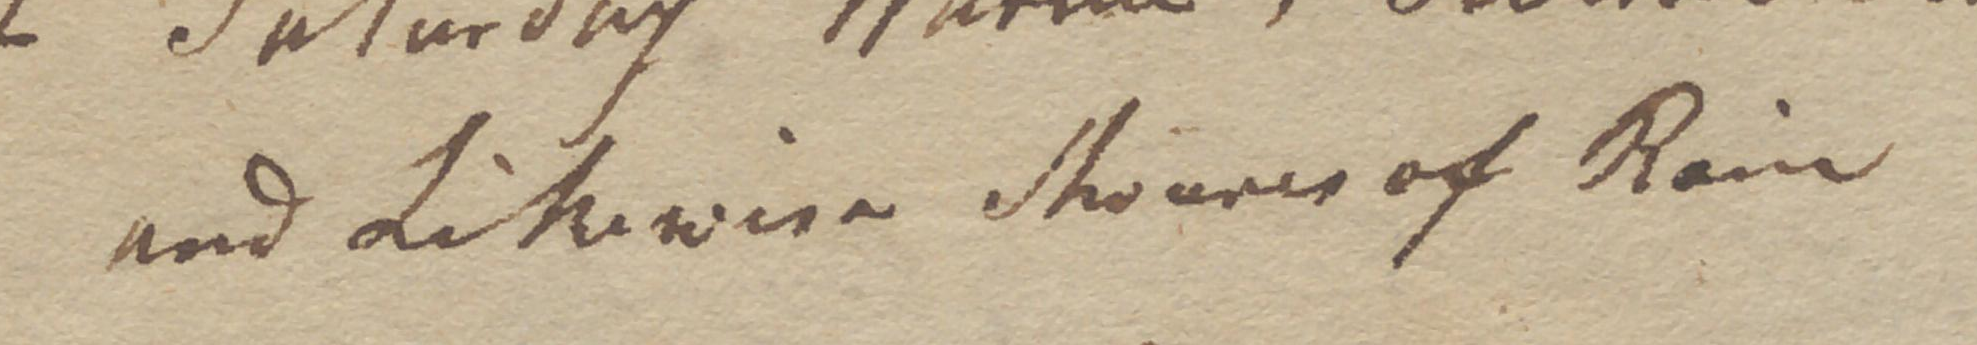and Likewise Shoures of Rain
